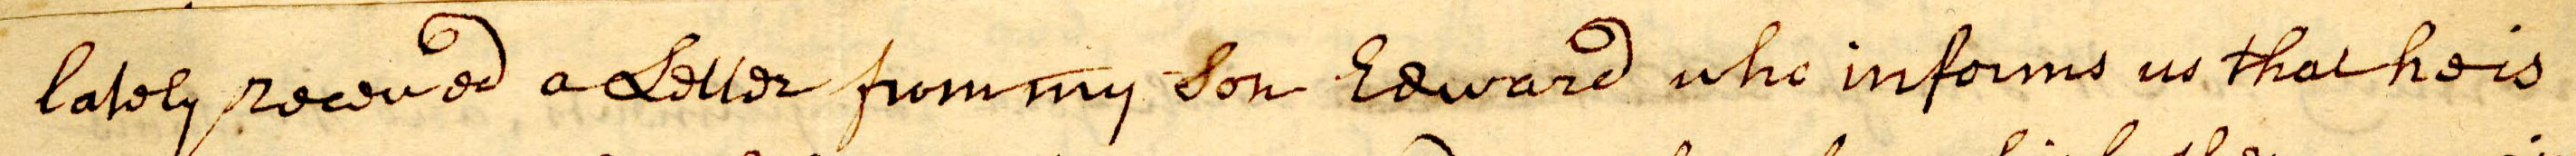lately received a Letter from my Son Edward who informs us that he is
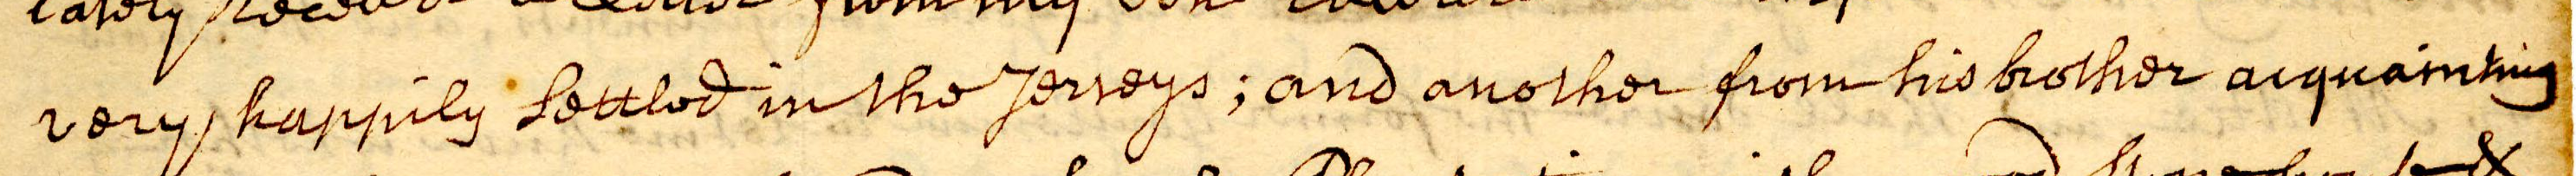very happily settled in the jerseys; and another from his brother acquainting
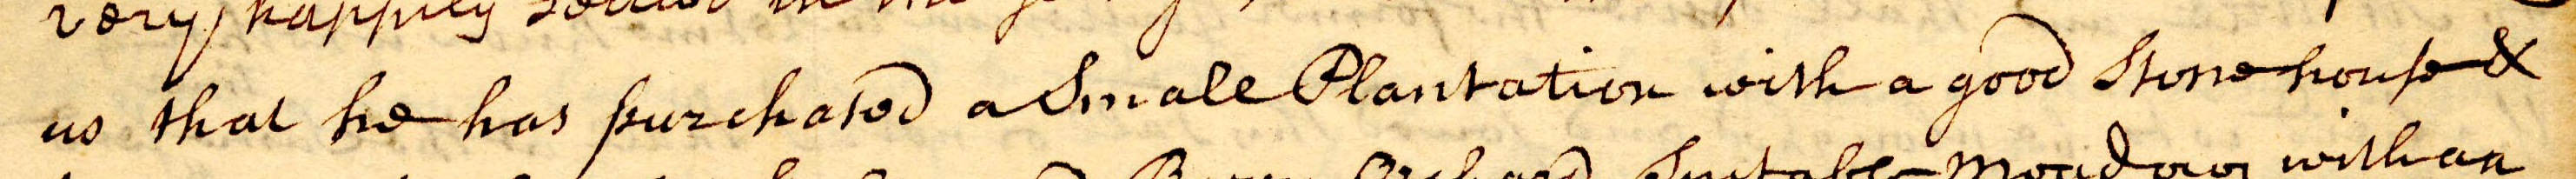us that he has purchased a Small Plantation with a good Stone house &
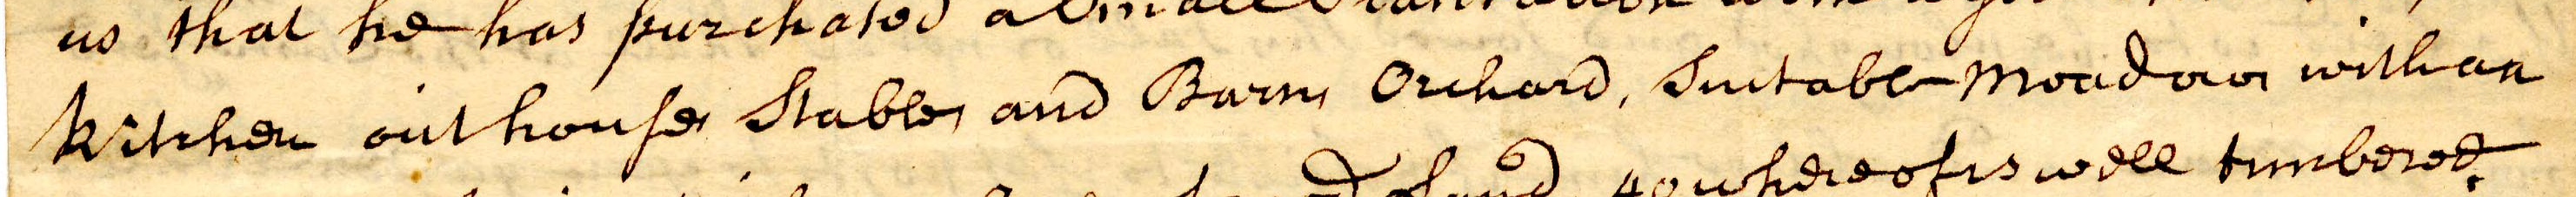kitchen out house Stables and Barns Orchard, Suitable meadow with an
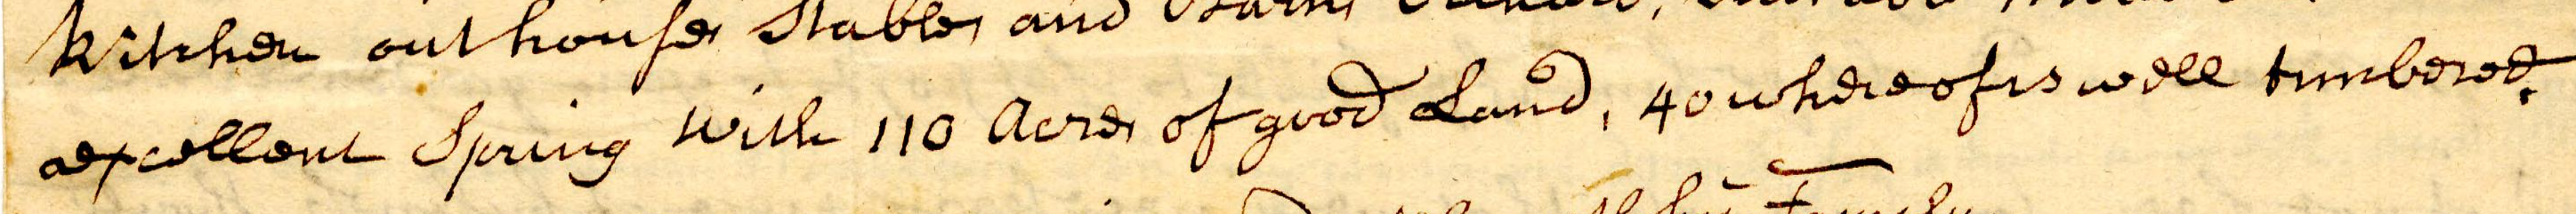excellent Spring with 110 Acres of good Land, 40 whereof is well timbered,
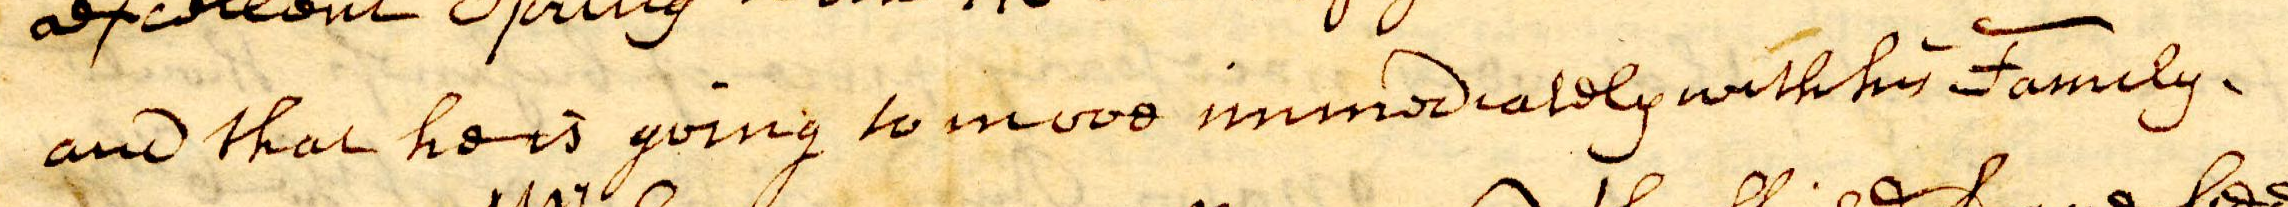and that he is going to move immediately with his Family.
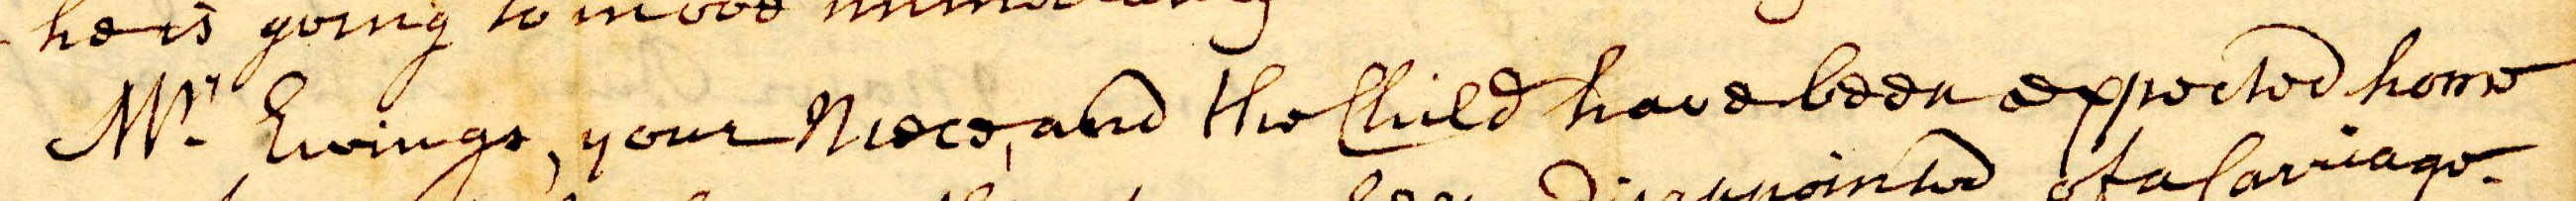M^r. Ewings, your Niece, and the Child have been expected home
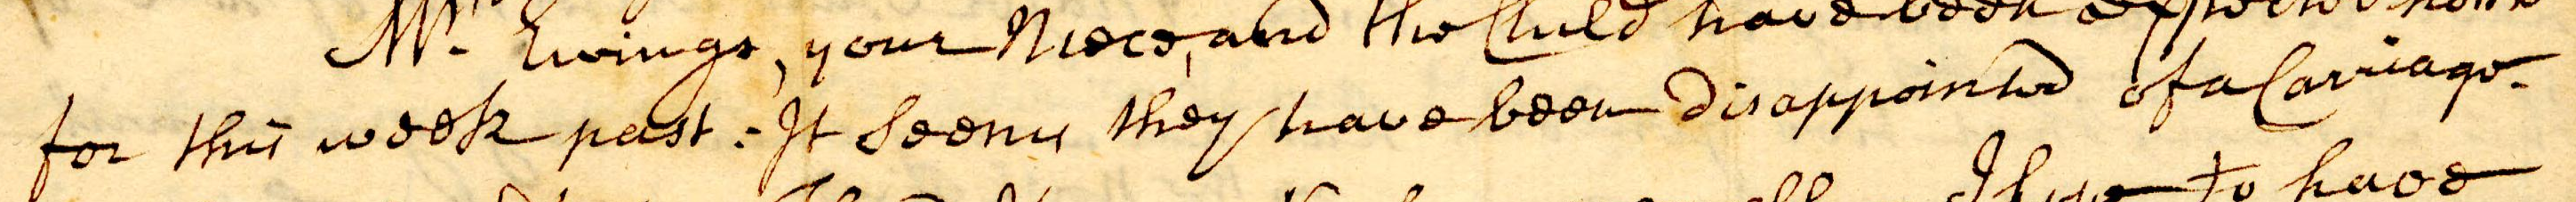for this week past. It seems they have been disappointed of a Carriage.
